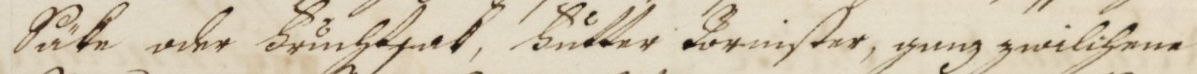Säke oder Fruchtsak, Futter Tornister, ganz zwilchene
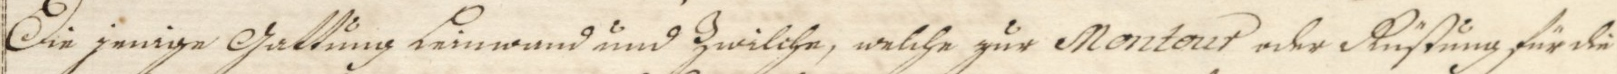Die jenige Gattung Leinwand und Zwilche, welche zur Montour oder Rüstung für die
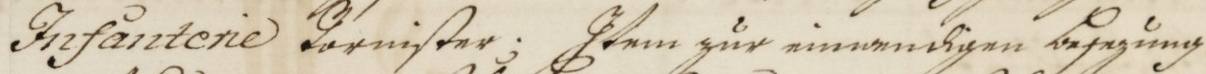Infanterie Tornister. Item zur einwendigen Besezung
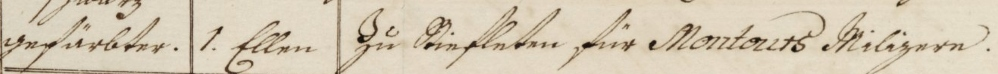gefärbter. 1. Ellen Zu Stiefleten für Montours Milizern.
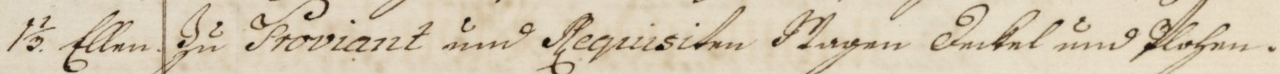1 1/3. Ellen. Zu Proviant und Requisiten Wagen Deckel und Plohen.
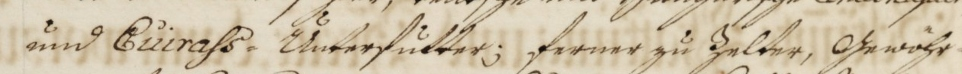und Cuirass- Unterfutter; ferner zu Zelter, Gewöhr
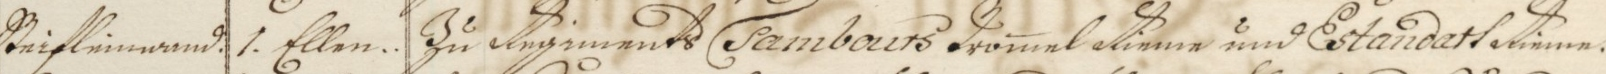Steifleinwand. 1. Ellen. Zu Regiments Tambours Trommel Rieme und Estandart Rieme.
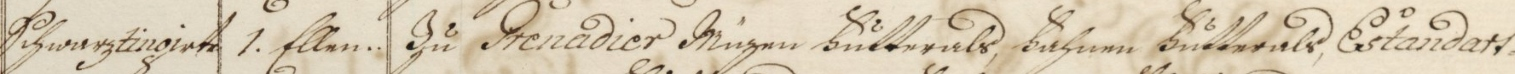Schwarztingirte 1. Ellen. Zu Grenadier Müzen Futterals, Fahnen Futterals, Estandart-
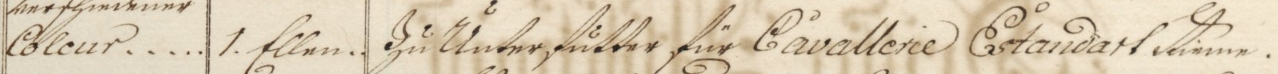Coleur... 1. Ellen... Zu Unterfutter für Cavallerie Estandart Rieme.
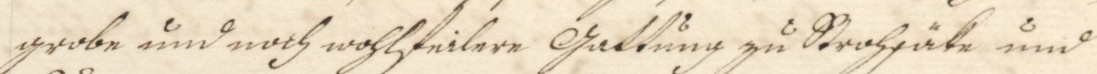grobe und noch wohlfeilere Gattung zu Strohsäke und
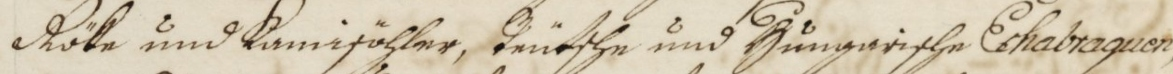Röke und Kamisöhler, Teütsche und Hungarische Echabraquen,
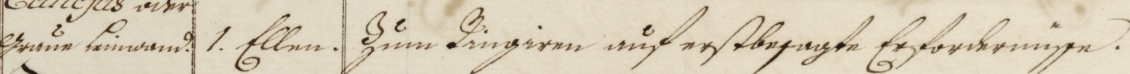Graue Leinwand. 1. Ellen. Zum Tingiren auf erstbesagte Erfordernüsse.
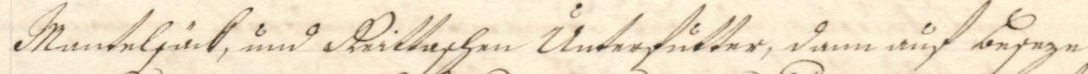Mantelsäck, und Reittaschen Unterfutter, dann auf Beseze
